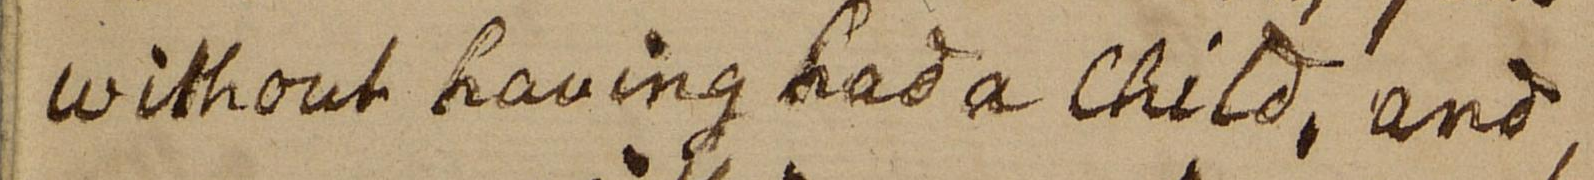without having had a Child, and
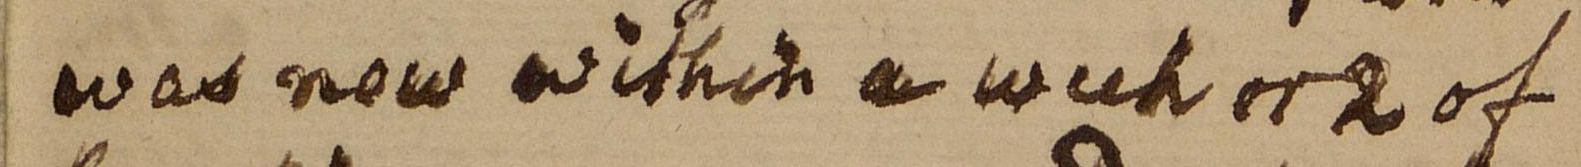was now within a week or 2 of
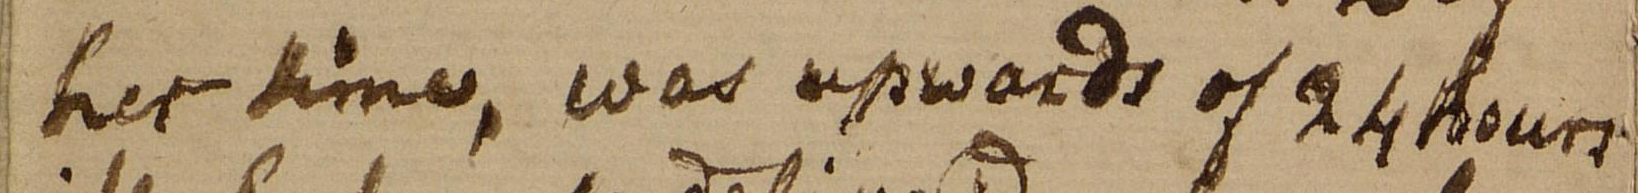her time, was upwards of 24 hours
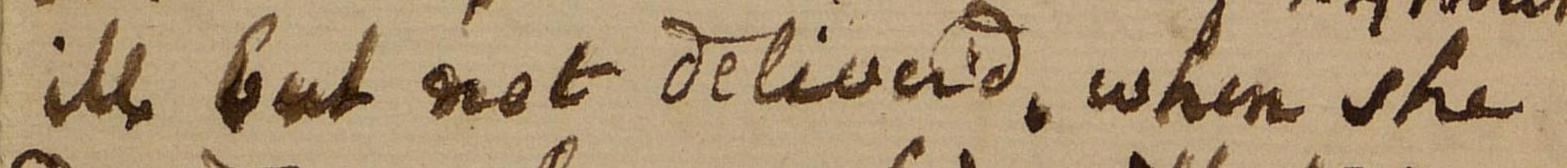ill but not deliver'd, when she
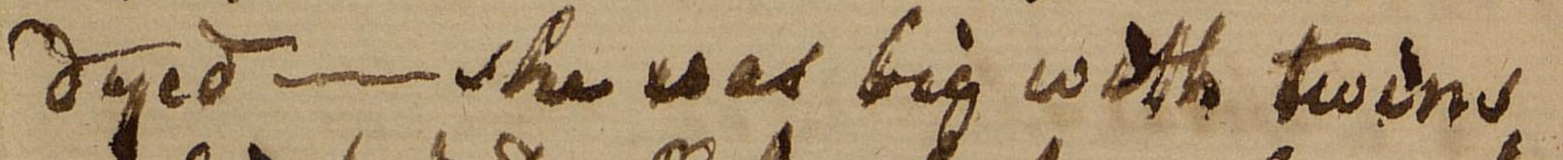dyed- she was big with twins
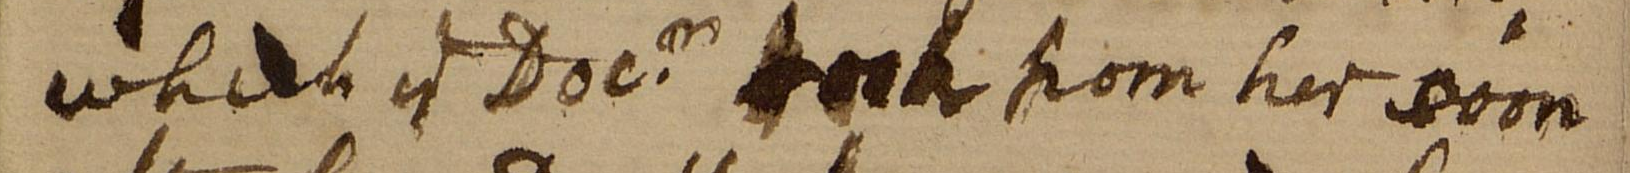which y^e Doc^r took from her soon
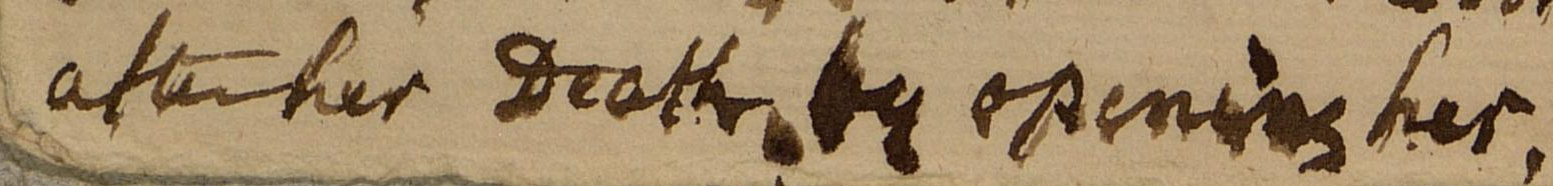after her Death by opening her,
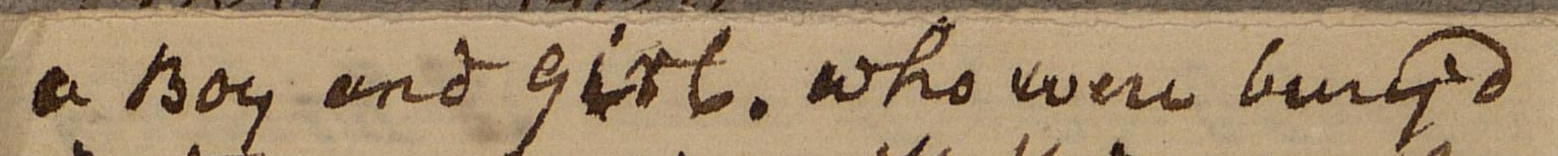a Boy and Girl. who were bury'd
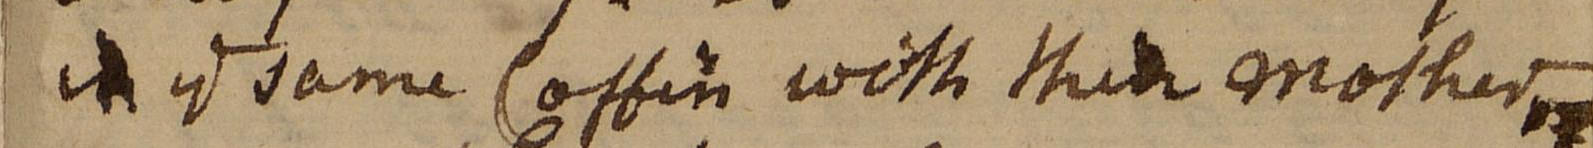in y^e same Coffin with their Mother.
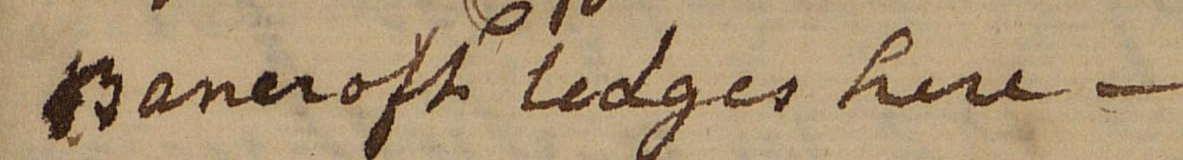Bancroft lodges here-
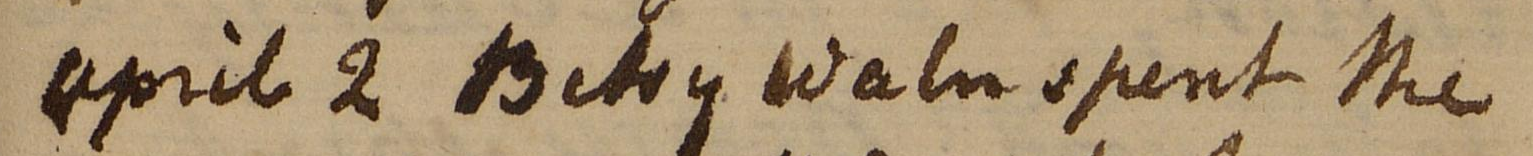April 2 Betsy Waln spent the
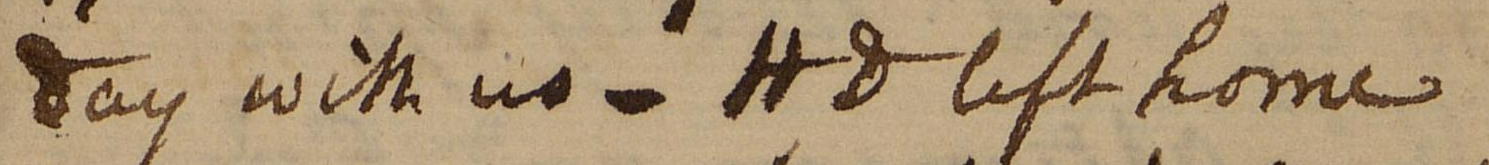day with us- HD left home
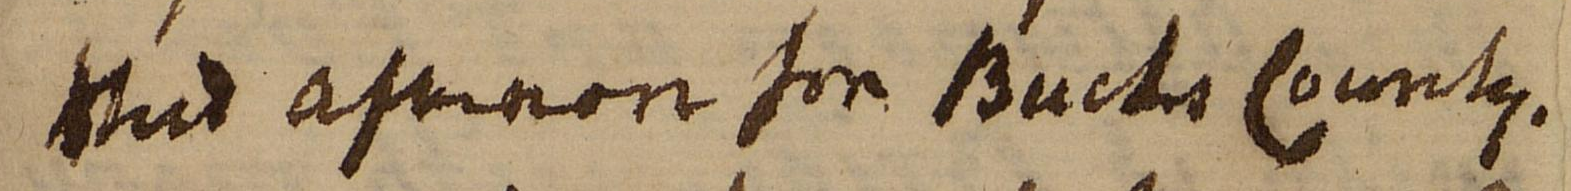this afternon for Bucks County.
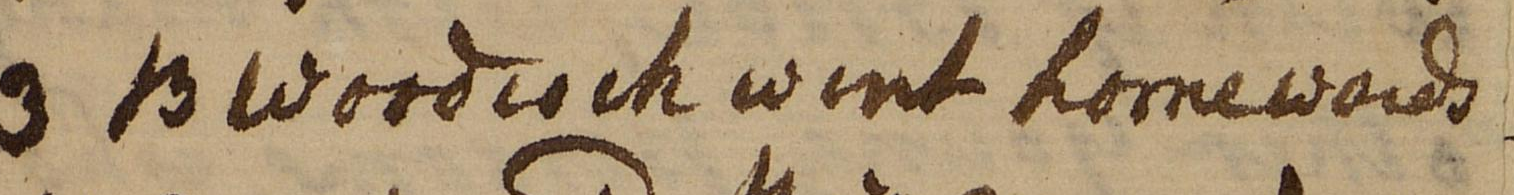3 B Wordcock went homewards
